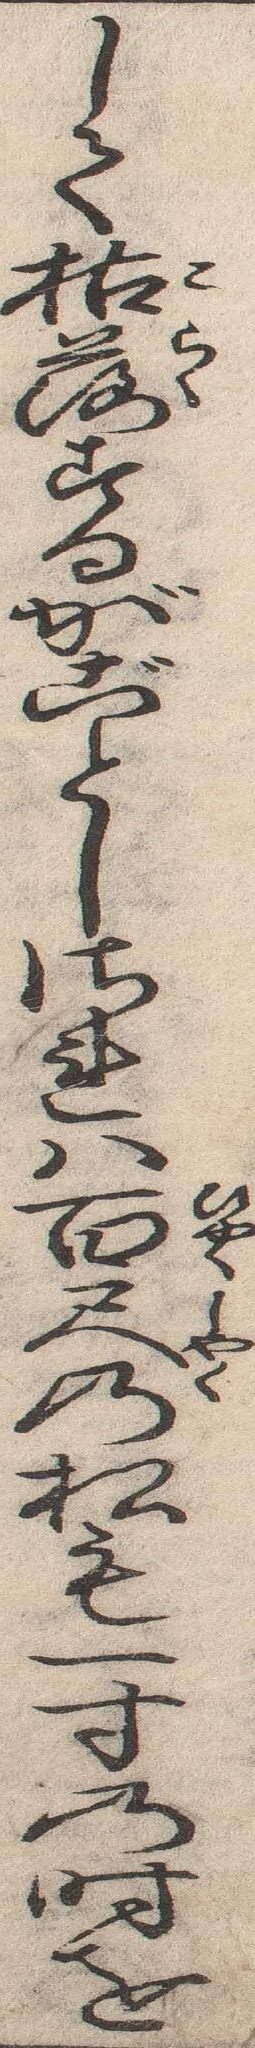して枯落するがごとしされは百尺の松も一寸の時を

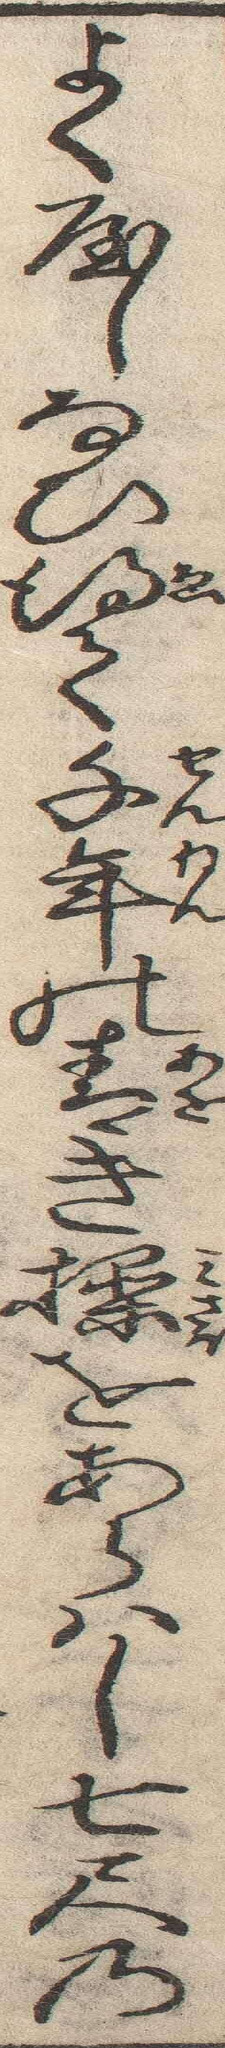よくやしなひ得て千年の青き操をあらはし七尺の
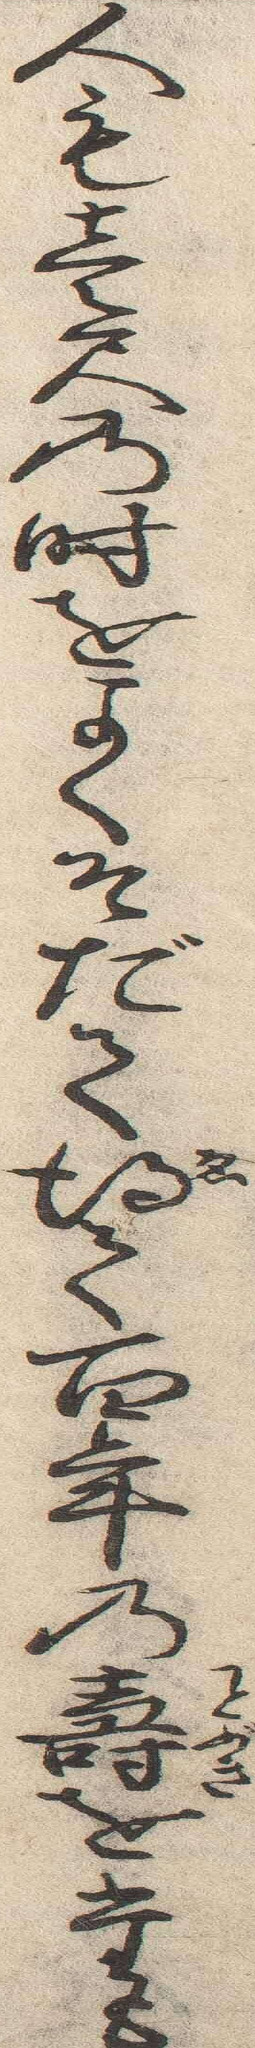人も壱尺の時をよくそだて得て百年の壽をたも
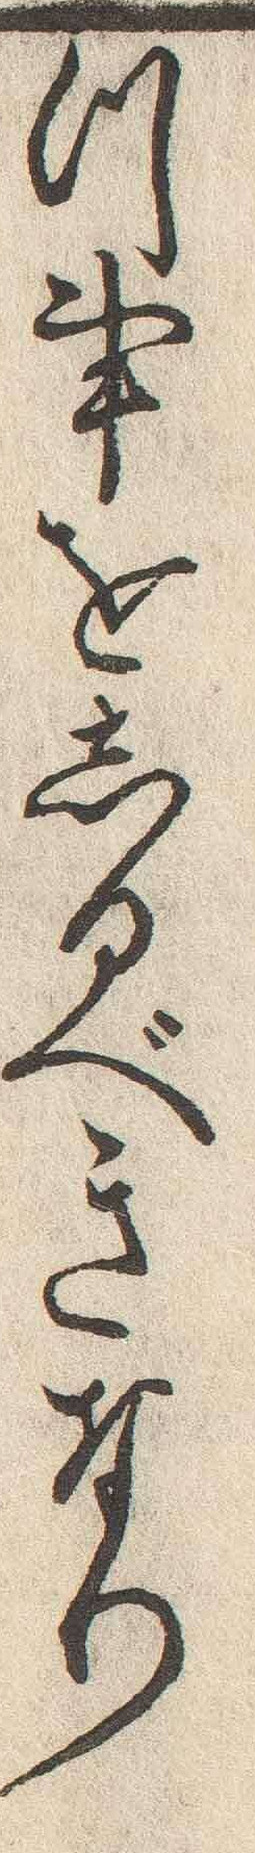つ事をしるべきなり
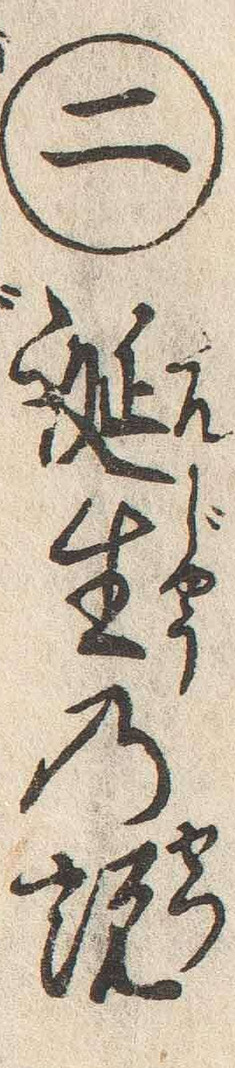㊁誕生の説
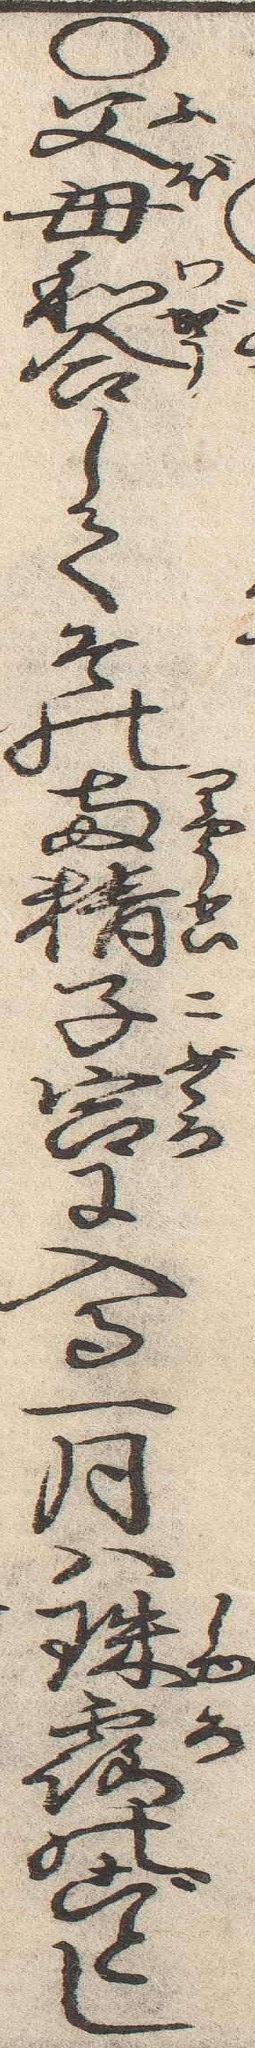◯父母和合してその両精子宮に入る一月は珠露のごとし
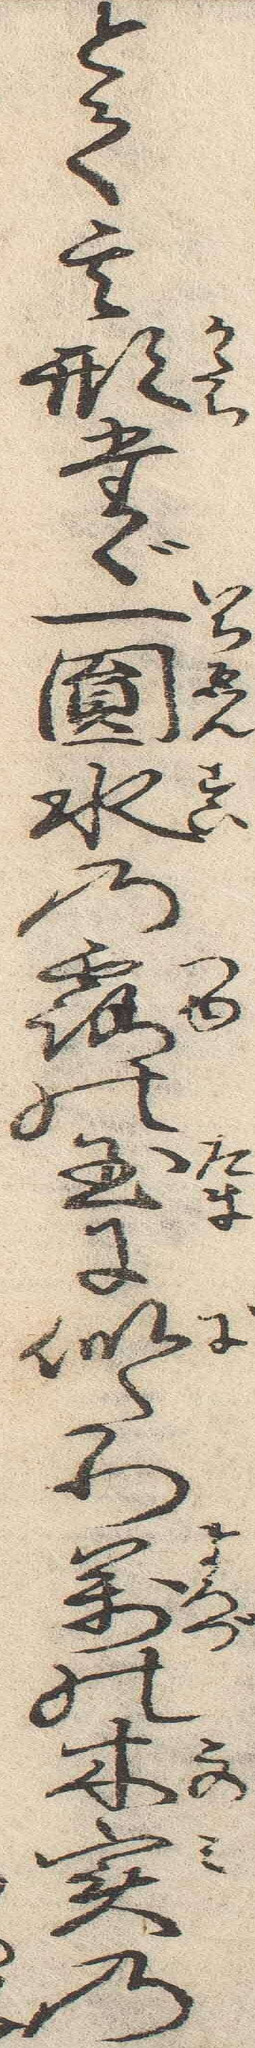とて其形たゞ一圓水の露の玉に似たり萬の木実の
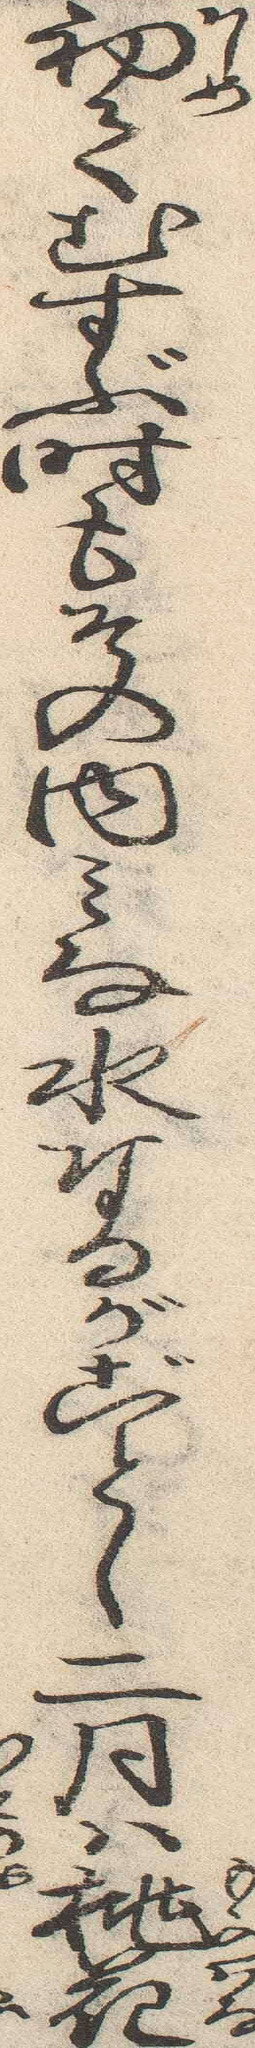初てむすぶ時もその内みな水なるがごとし二月は桃花
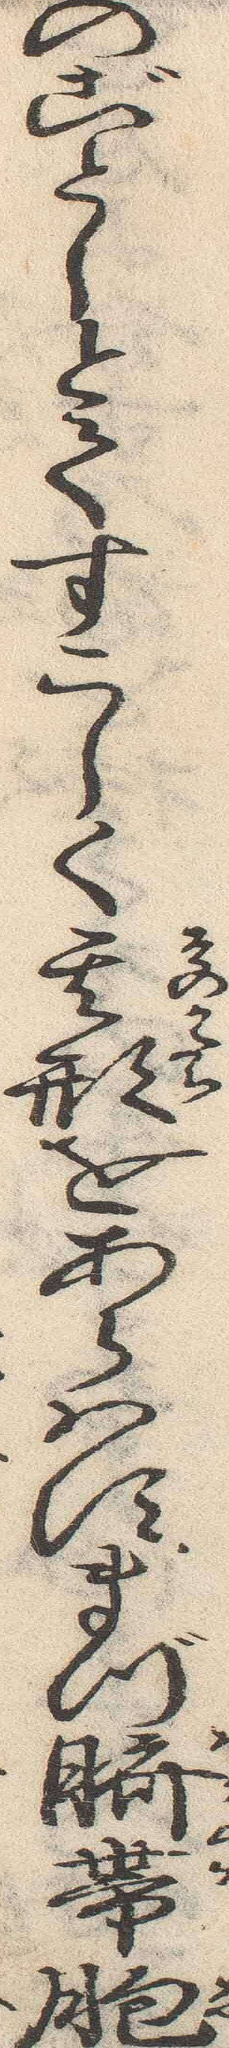のごとしとてすこしく其形をあらはすまづ臍帯胞
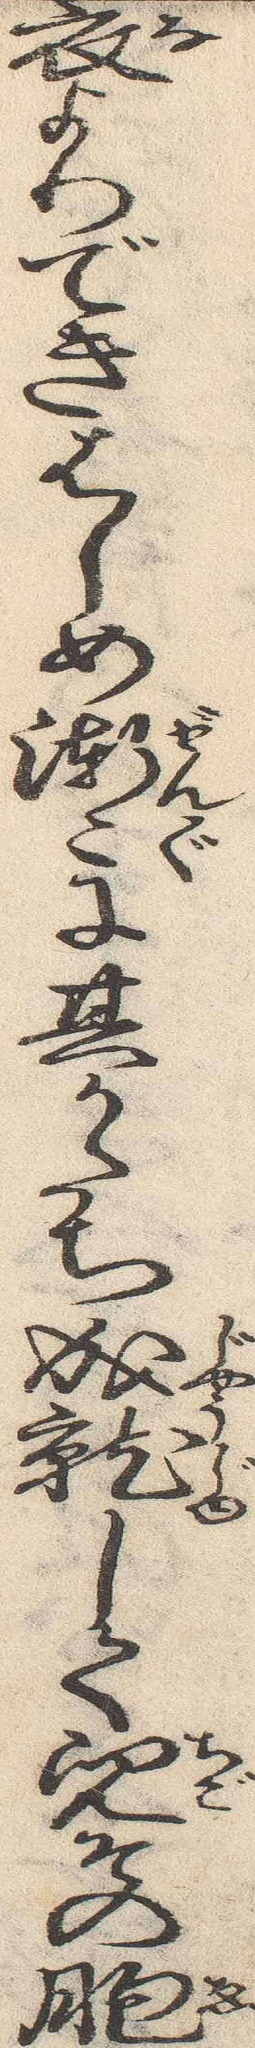衣よりできはしめ漸〻に其かたち成就して児その胞
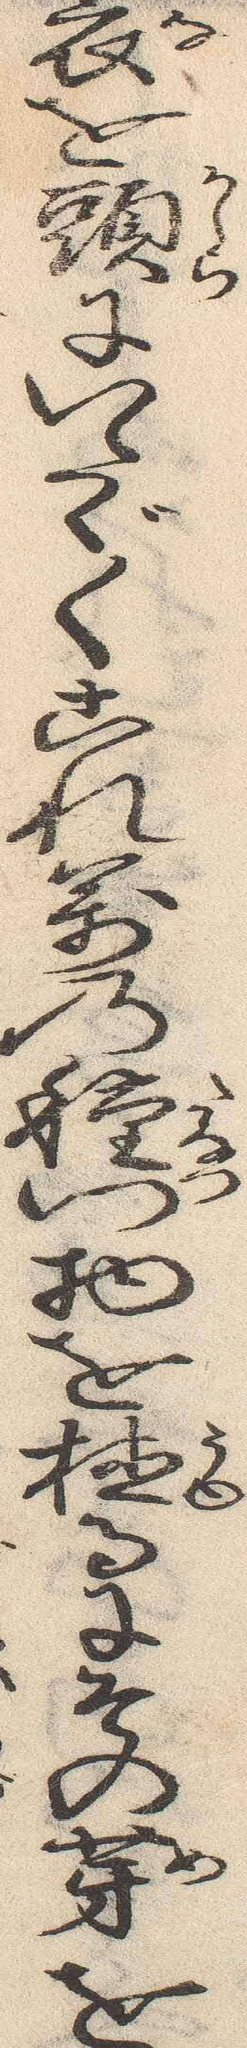衣を頭にいたゞくこれ萬の種つ物を植るにその芽を
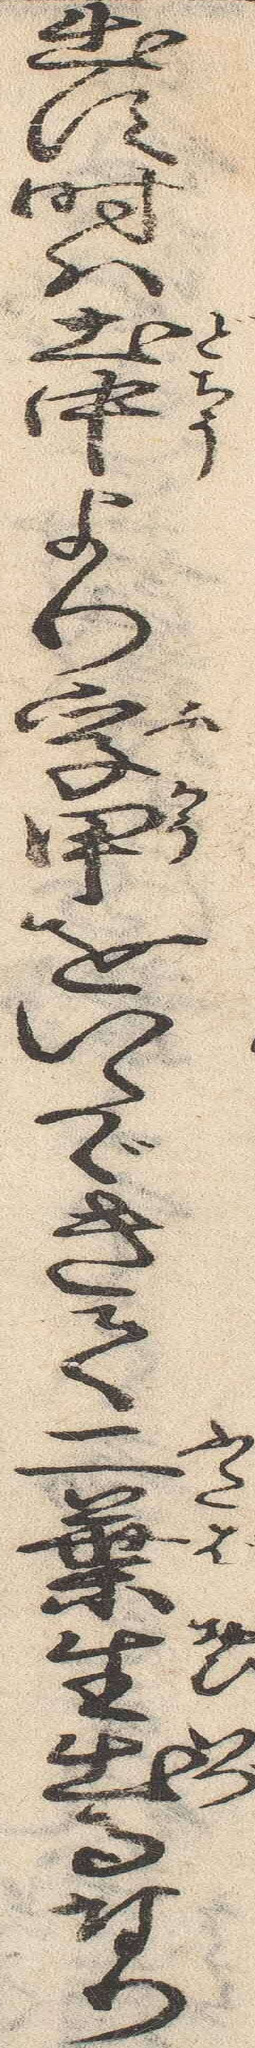出す時は土中より孚甲をいたゞきて二葉生出るなり
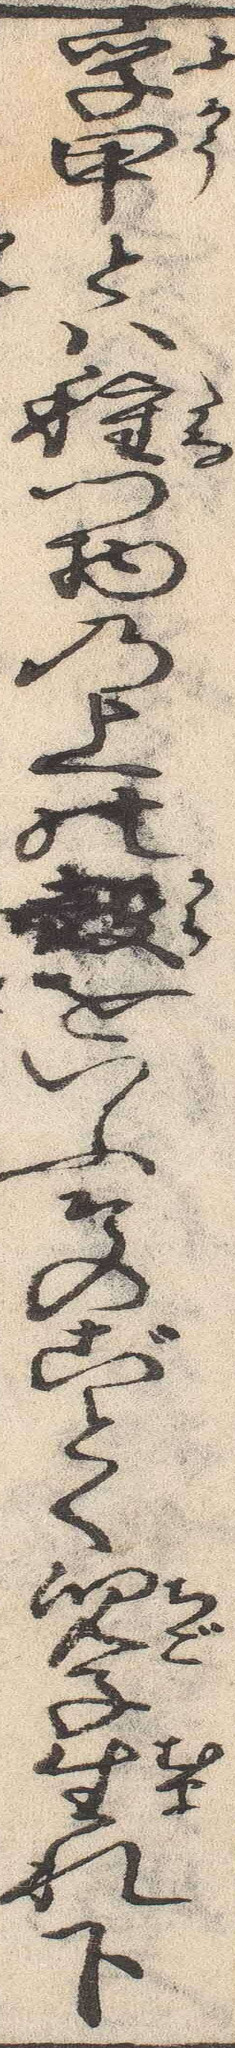孚甲とは種つ物の上の殻をいふそのごとく児子生れ下
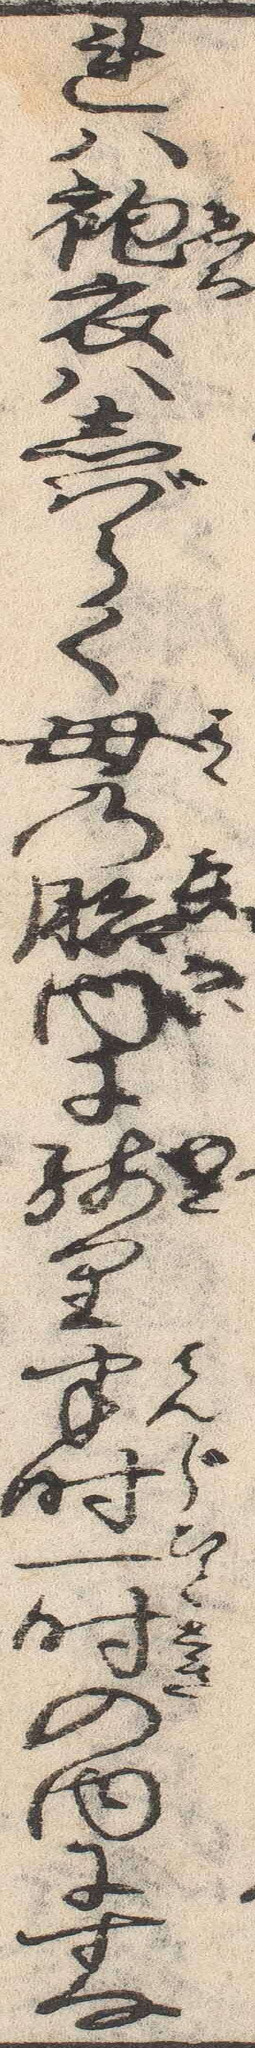れは袍衣はしばらく母の胎内に残り半時一時の内にすな
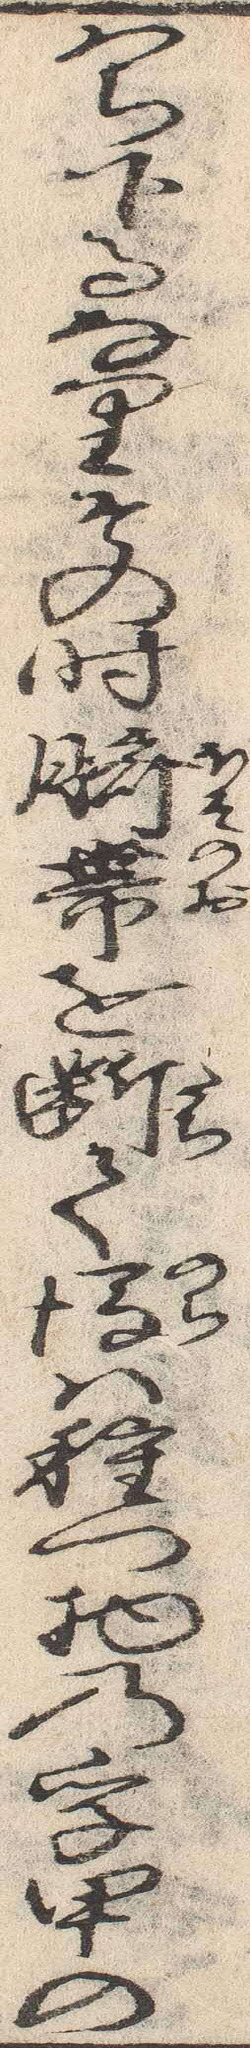はち下るなりその時臍帯を断て後は種つ物の孚甲の
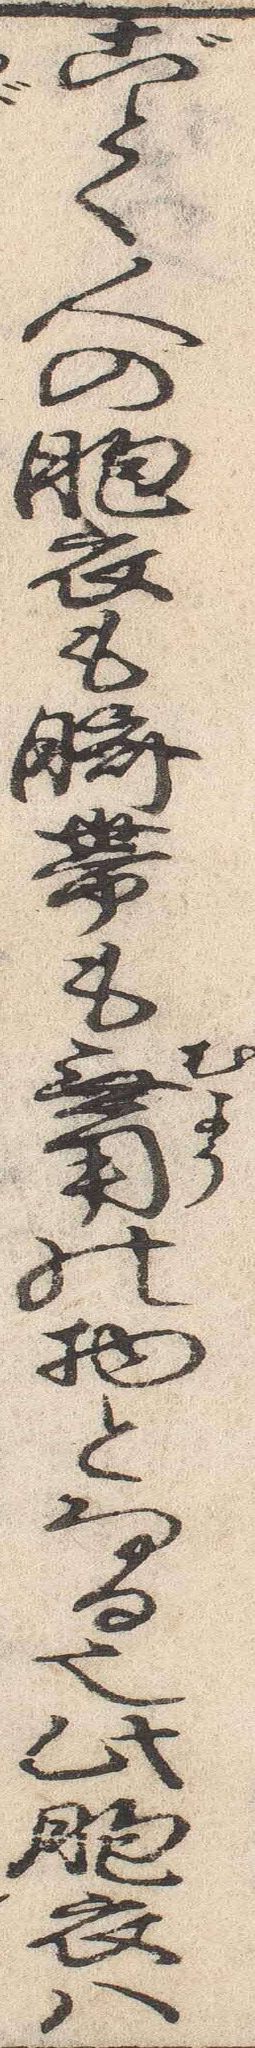ごとく人の胞衣も臍帯も無用の物となる也此胞衣は
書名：小児必用養育草
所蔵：東京学芸大学附属図書館 国文学研究資料館
